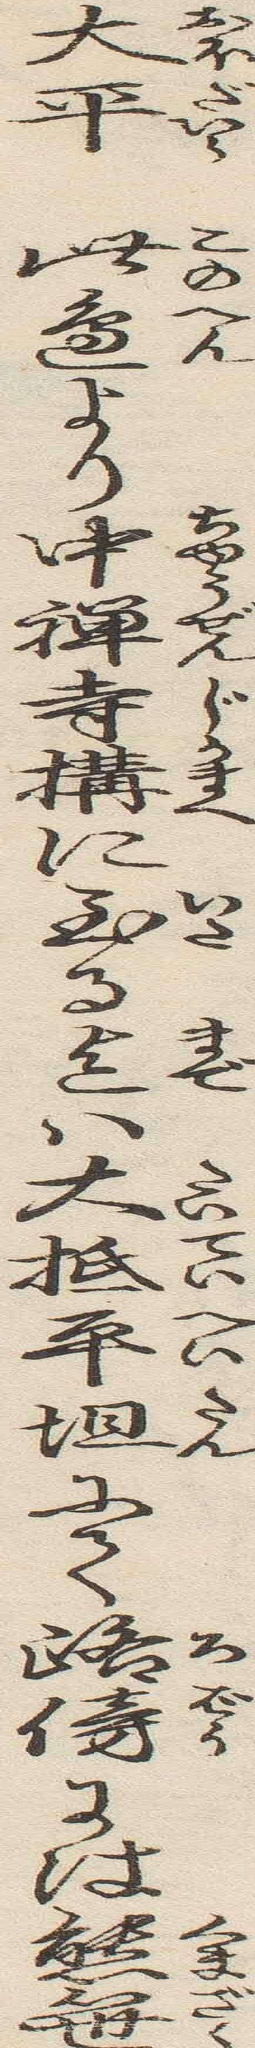大平此邊より中禅寺構に至る迄は大抵平坦にて路傍には熊笹
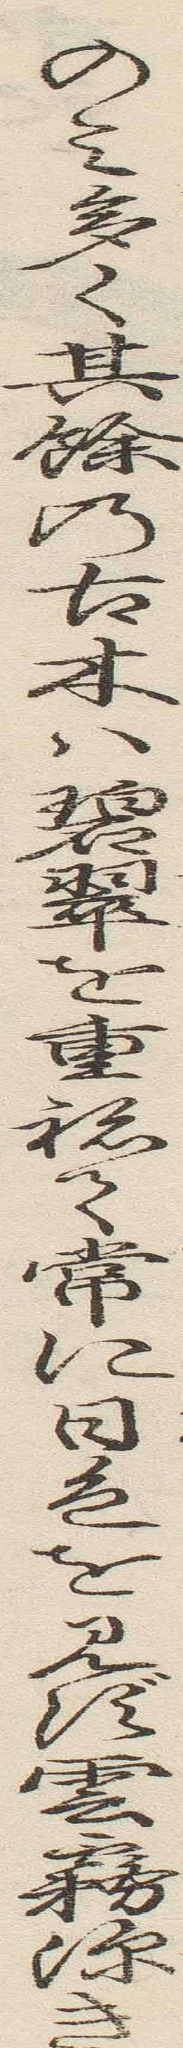のみ多く其餘の古木は碧翠を重ねて常に日色を見ず雲霧深き
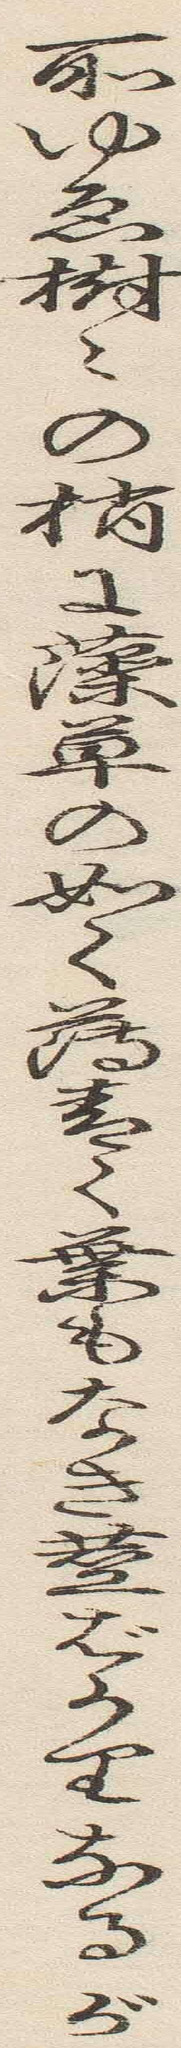所ゆゑ樹〻の梢に藻草の如く薄青く葉もなき莖ばかりなるが
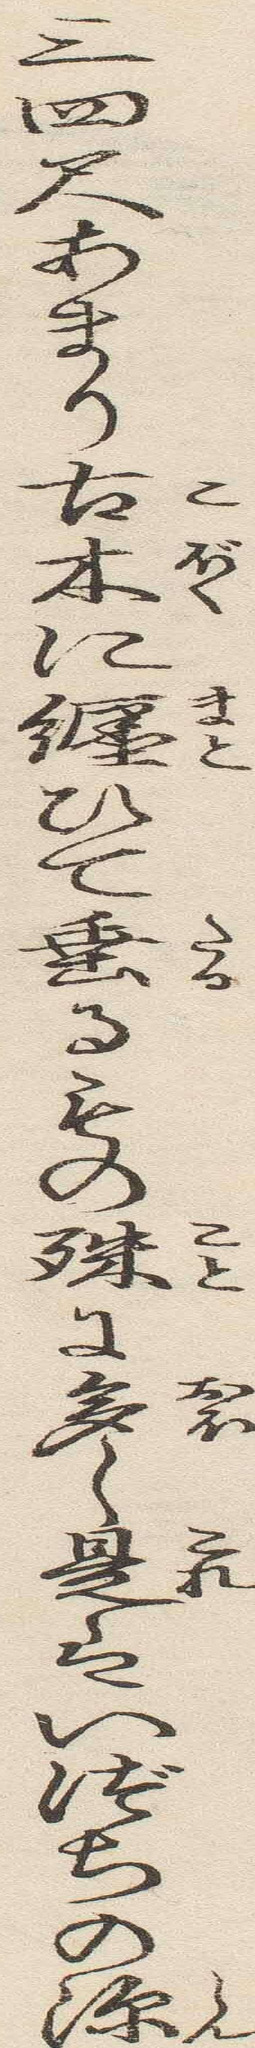三四尺あまり古木に纒ひて垂るもの殊に多し是はいづちの深
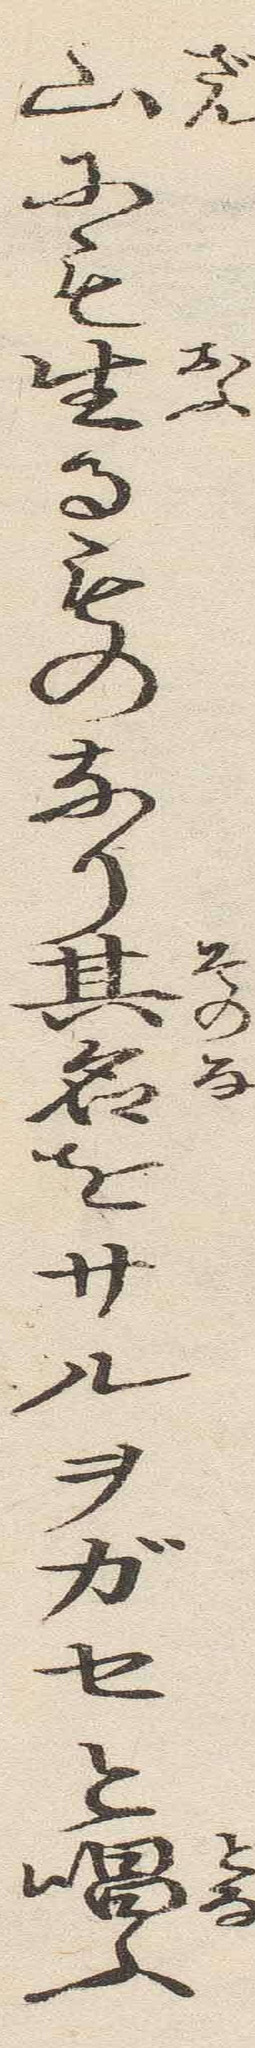山にも生るものなり其名をサルヲガセと唱ふ

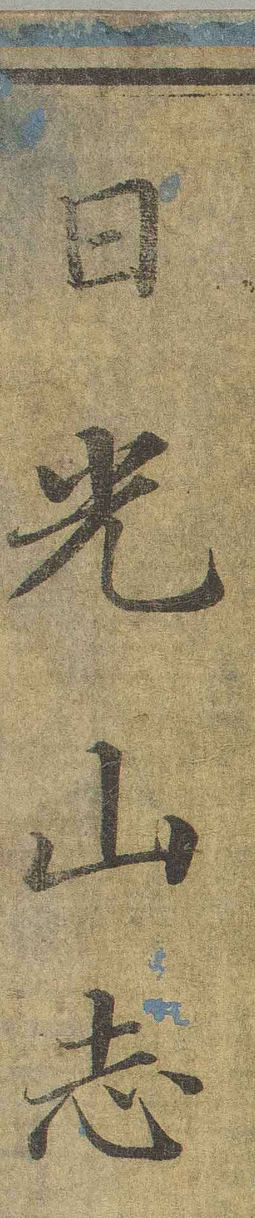日光山志四

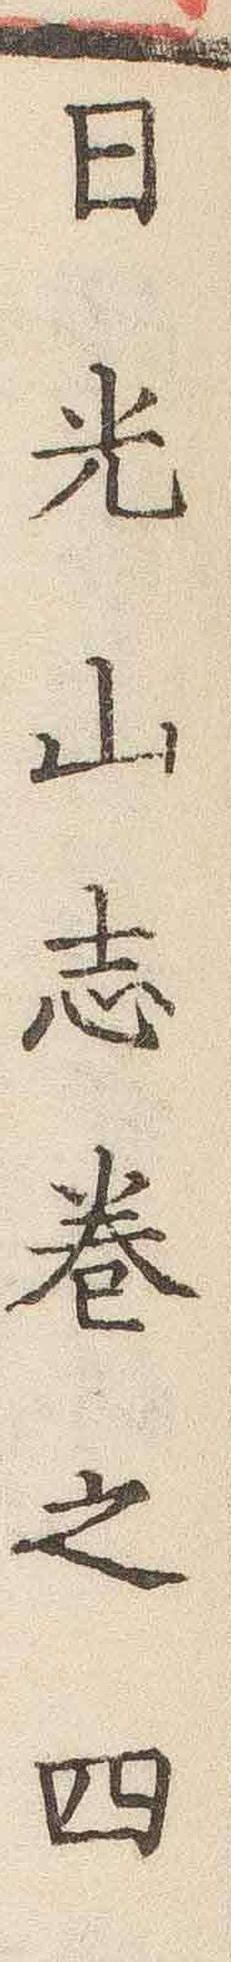日光山志巻之四

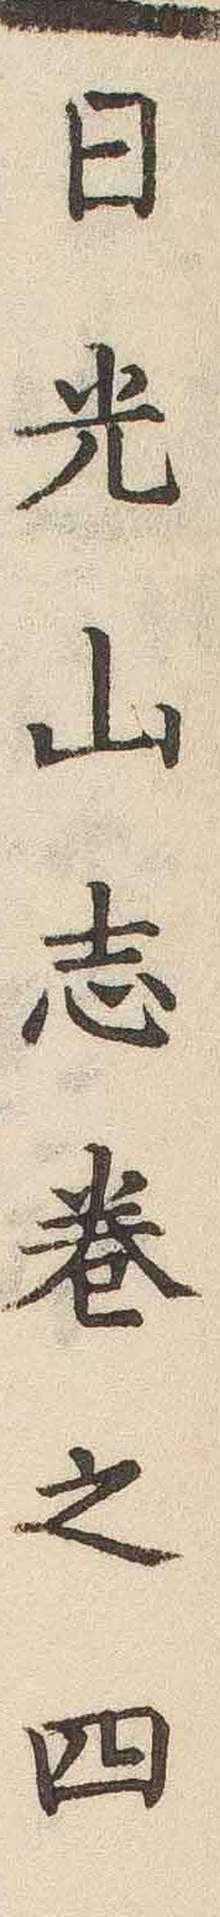日光山志巻之四
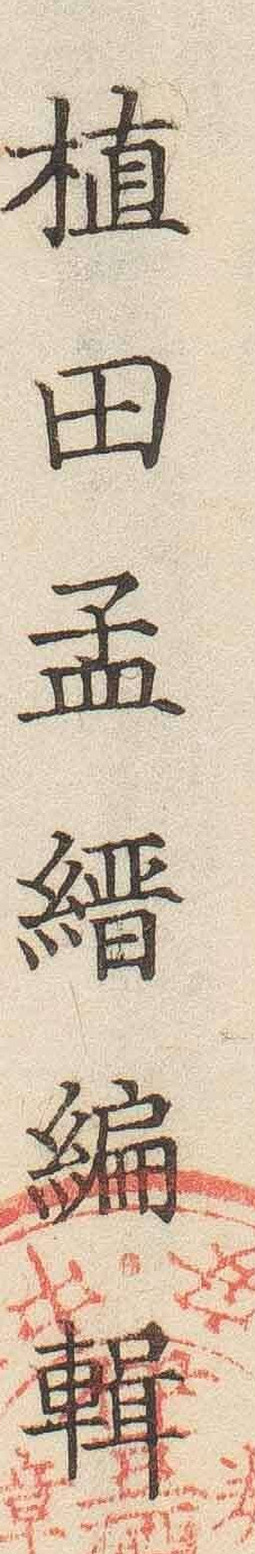植田孟縉編輯
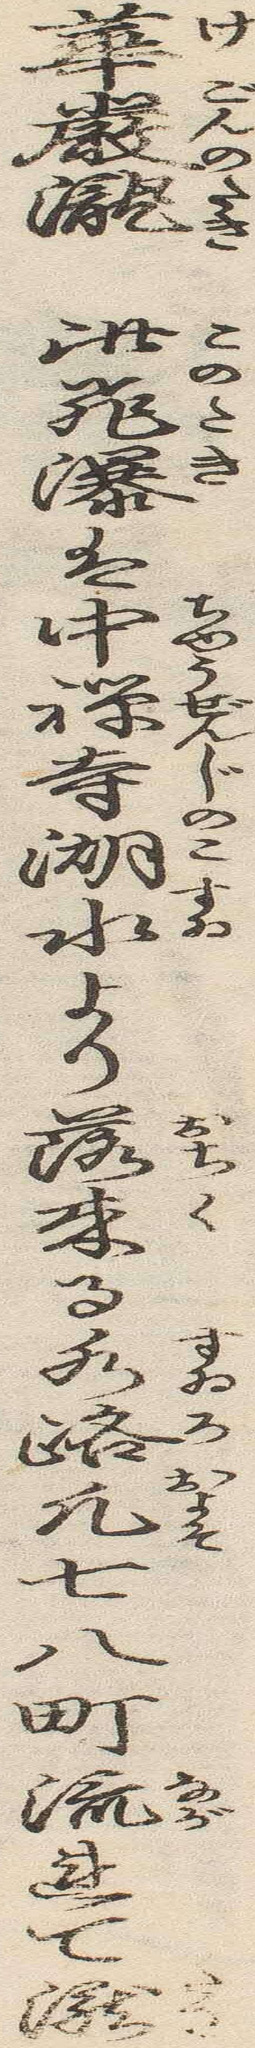蕐嚴瀧此飛瀑は中禅寺湖水より落來る水路凢七八町流れて瀧
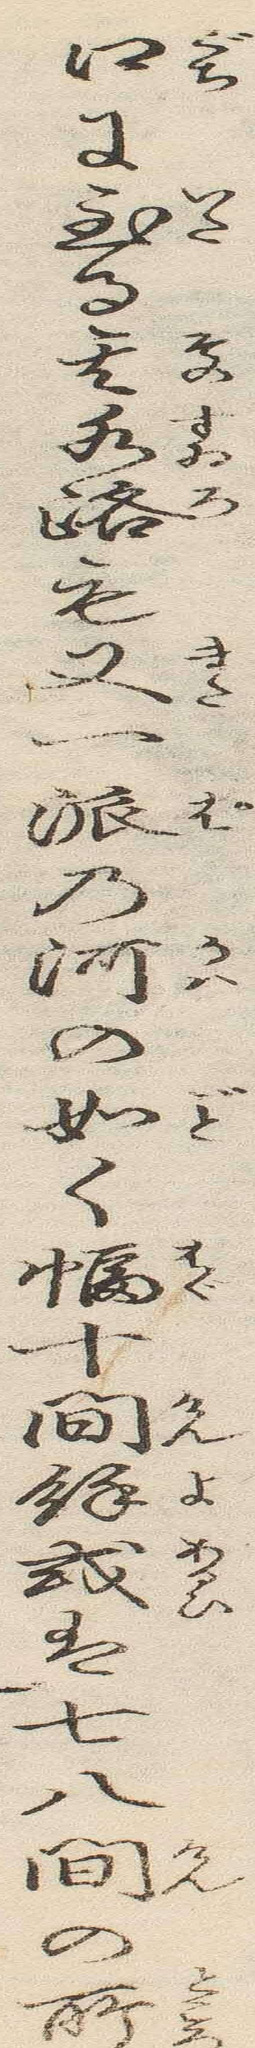口に至る其水路も又一派の河の如く幅十間餘或は七八間の所
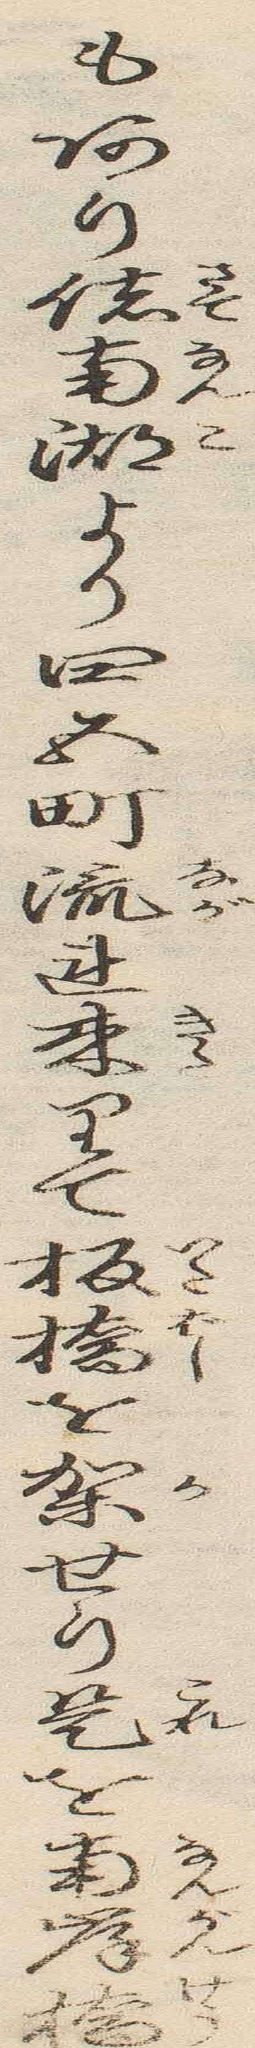もあり偖南湖より四五町流れ來りて板橋を架せり是を南岸橋
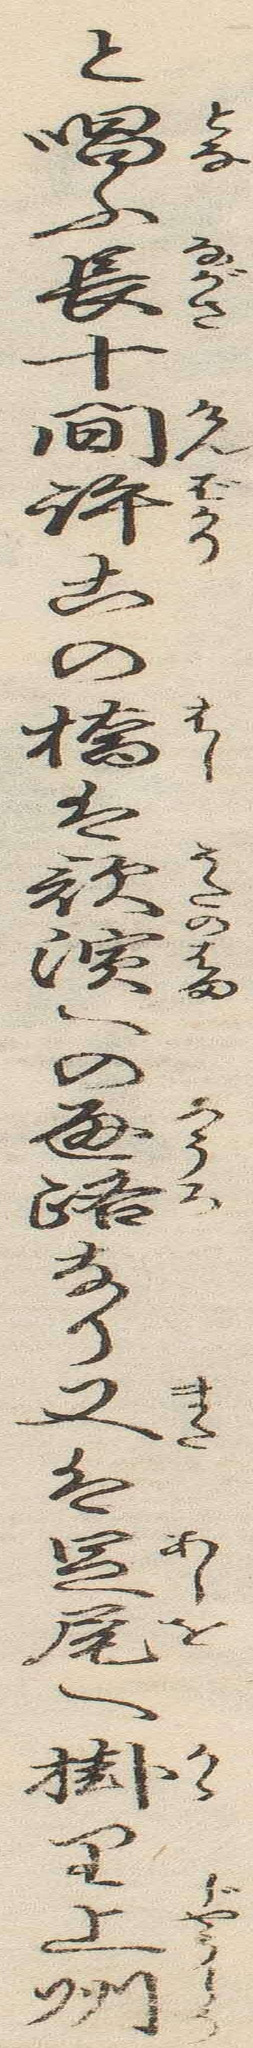と唱ふ長十間許この橋は歌濱への通路なり又は足尾へ掛り上州
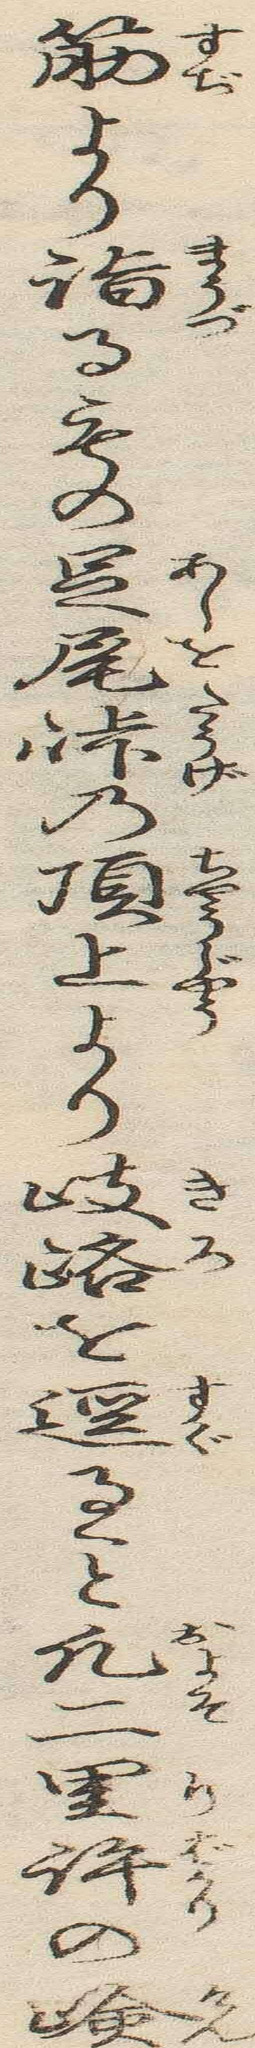筋より詣るもの足尾峠の頂上より岐路を逕ること凢二里許の𡸴
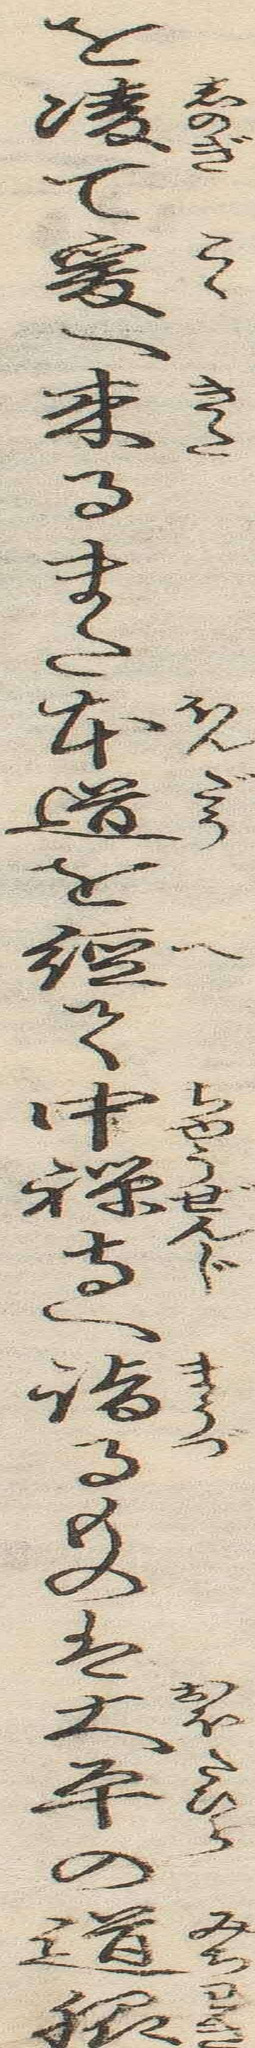を凌て爰へ來るまた本道を經て中禅寺へ詣るものは大平の道脇
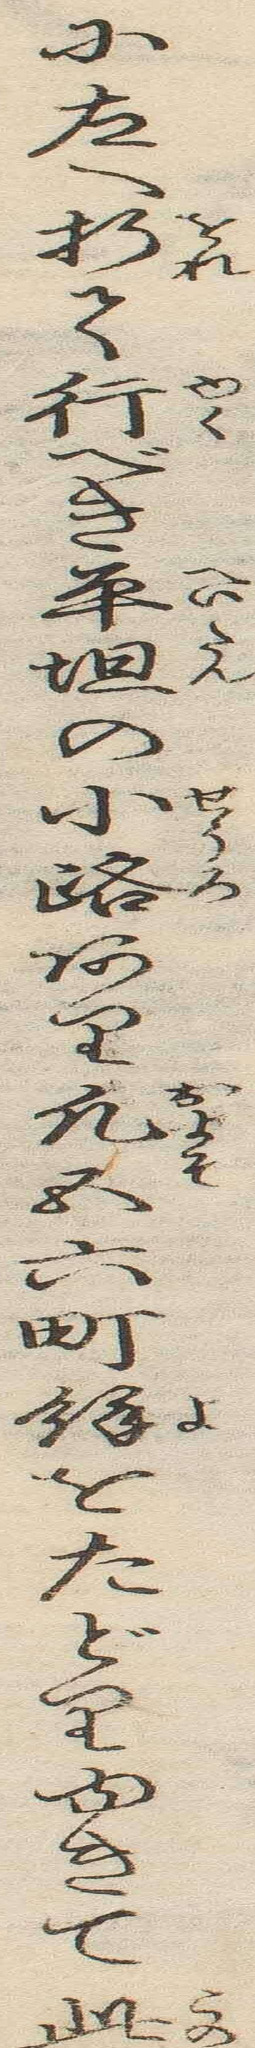に左へ折て行べき平坦の小路あり凢五六町餘をたどりゆきて此
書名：日光山志
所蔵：東京学芸大学附属図書館 国文学研究資料館
